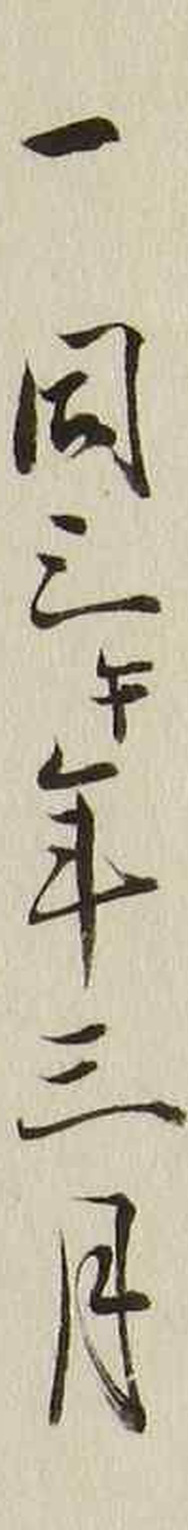一同三午年三月
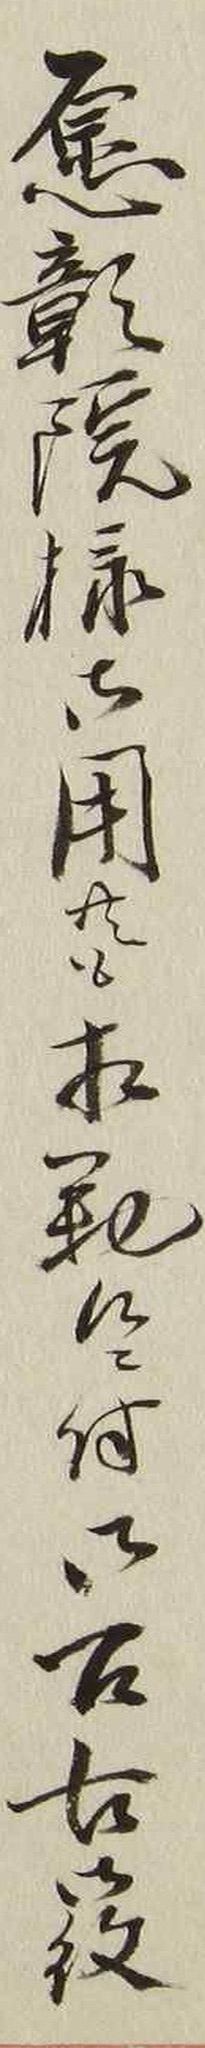愿彰院様御用共も相勤候ニ付御召古御紋
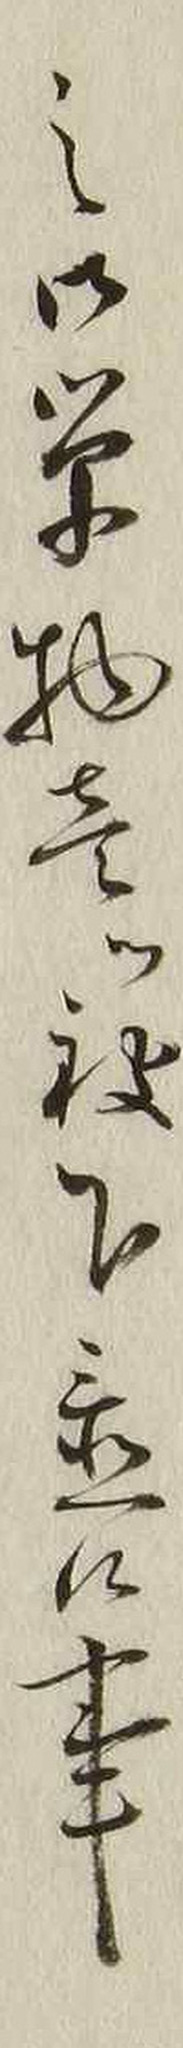之御単物壱ッ被下置候事
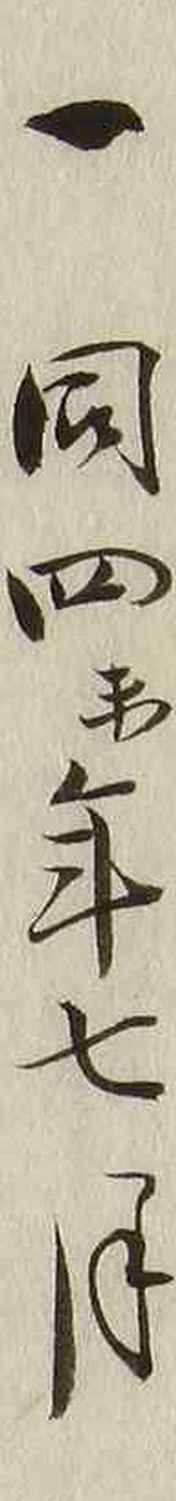一同四未年七月
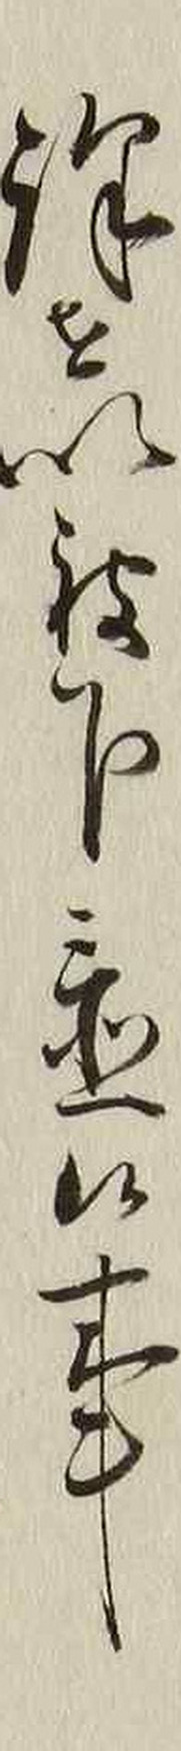訳を以被下置候事
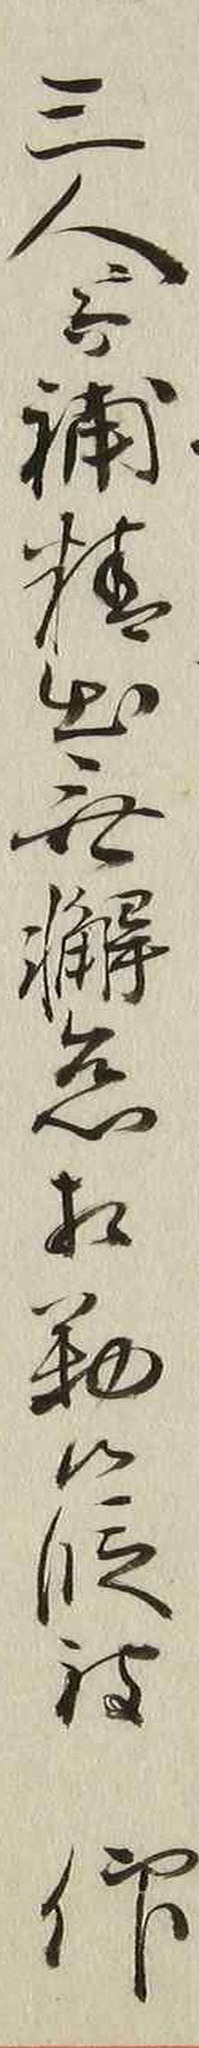三人ニ而補精出無懈怠相勤候段被仰
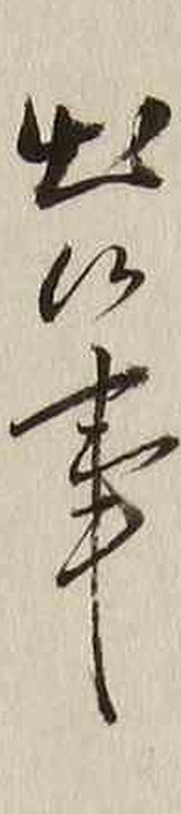出候事
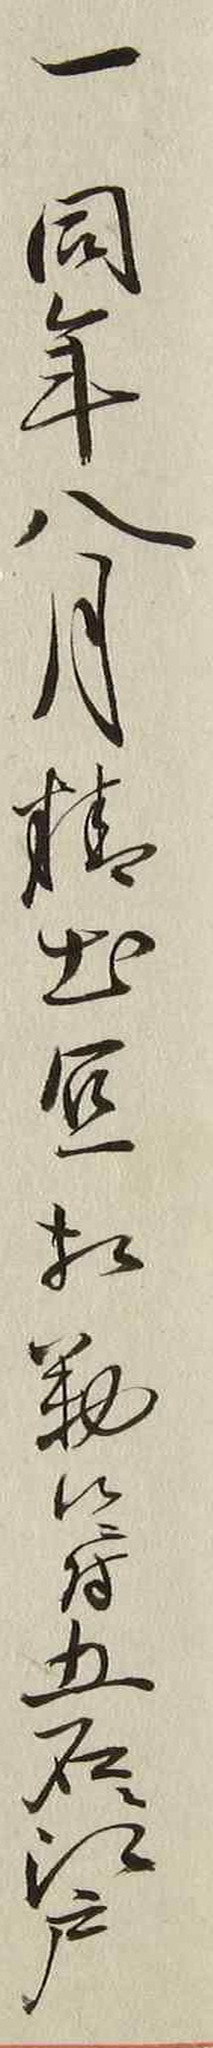一同年八月精出宜相勤候ニ付五石ニ江戸
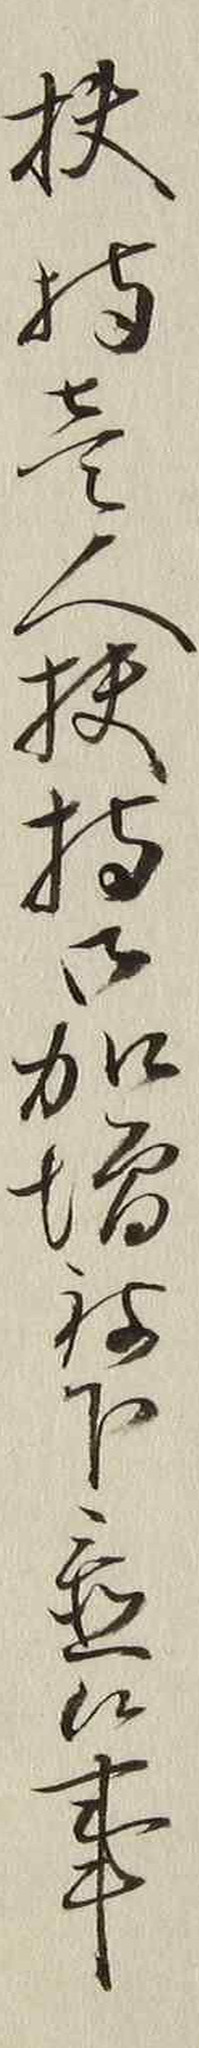扶持壱人扶持御加増被下置候事
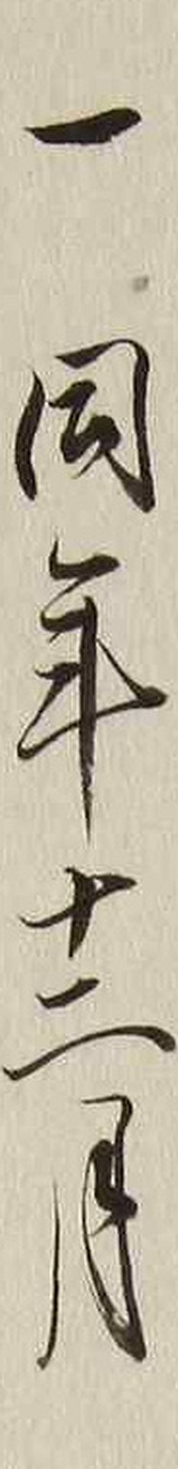一同年十二月
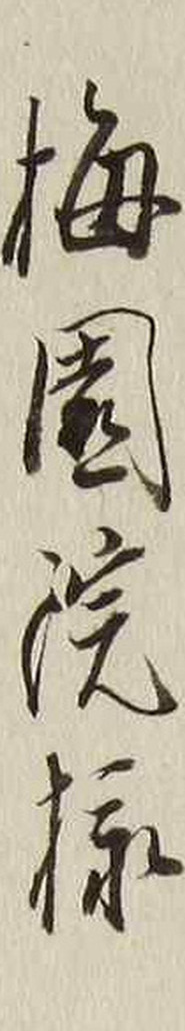梅園院様
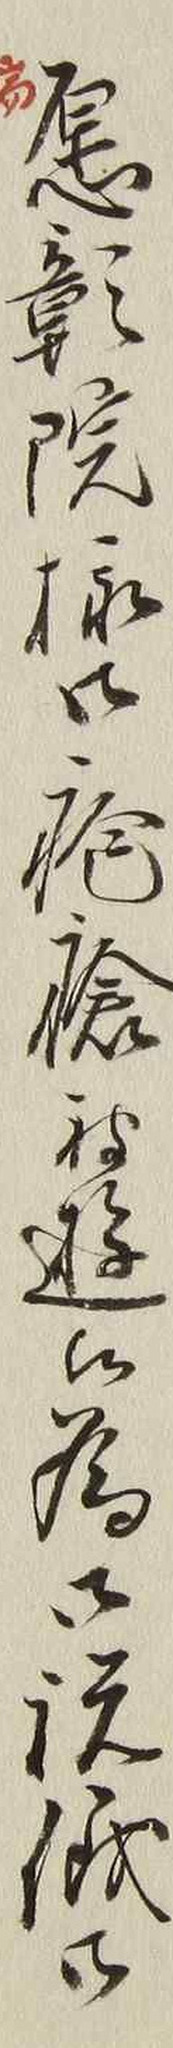愿彰院様御疱瘡被遊候為御祝儀御
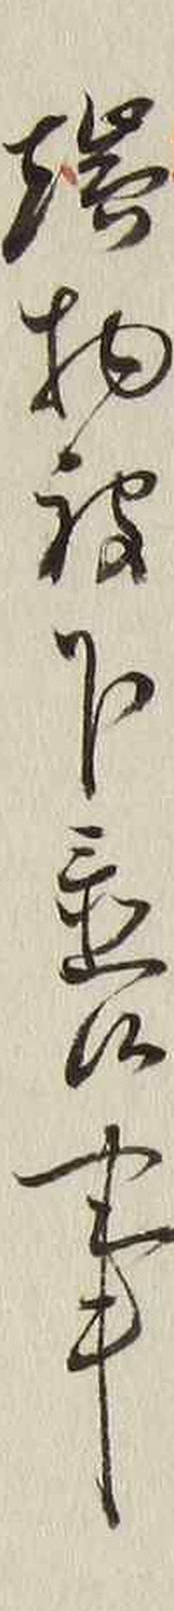端物被下置候事
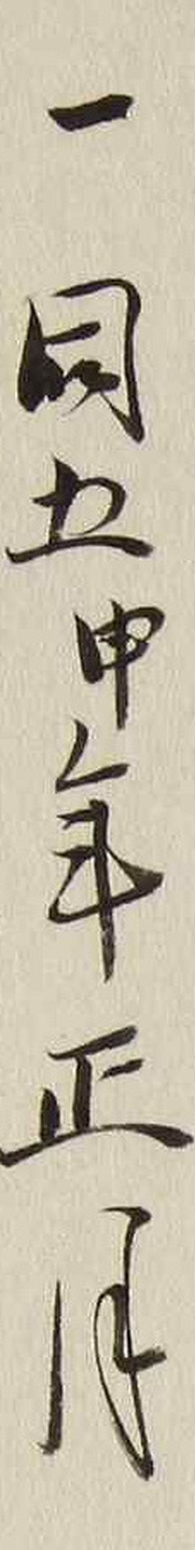一同五申年正月
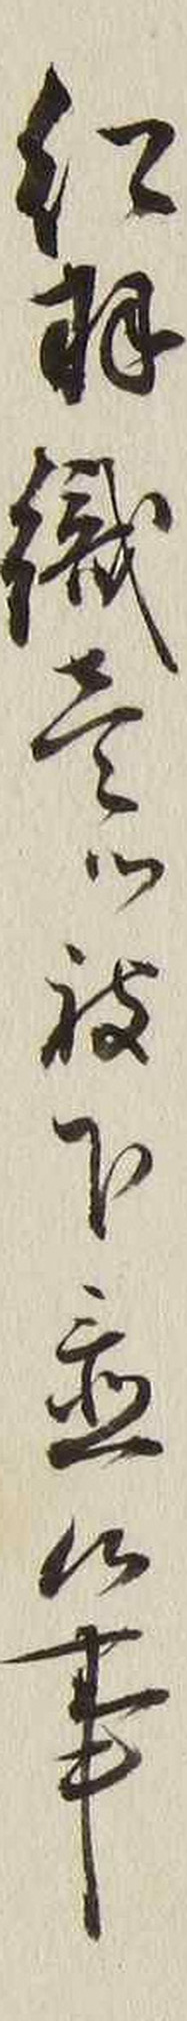紅羽織壱ッ被下置候事
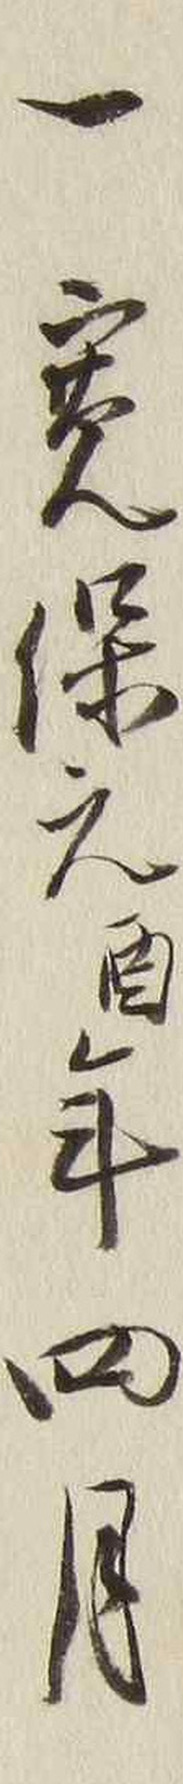一寛保元酉年四月
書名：諸士系譜　巻之163　な之部5
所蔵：会津若松市立会津図書館
